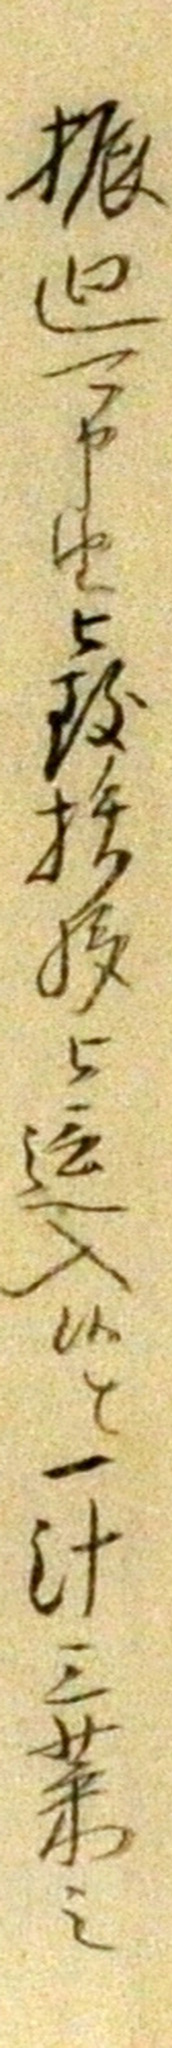振廻可申由被致挨拶被這入候と一汁三菜之
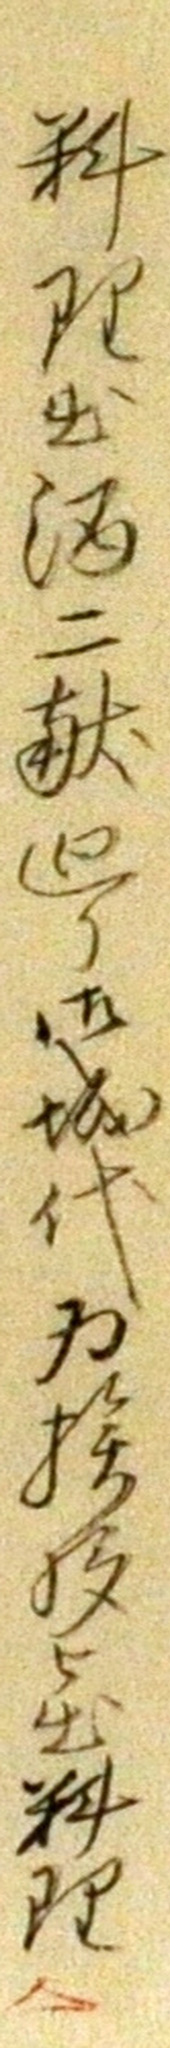料理出酒二献廻り御城代為挨拶被出料理
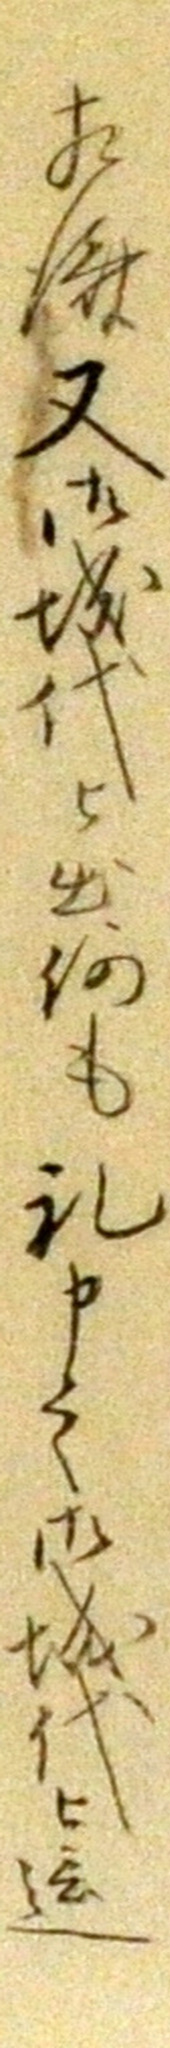相済又御城代被出何も礼申上候御城代被這
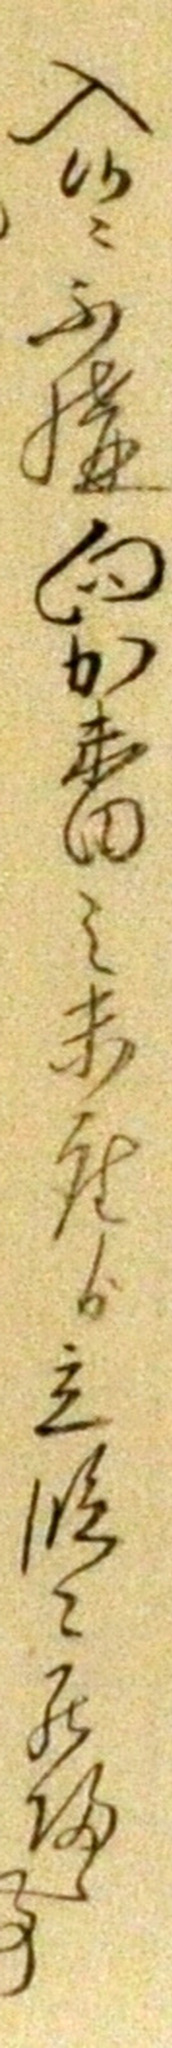入候に不構向加番之末座ゟ立段々罷帰候事
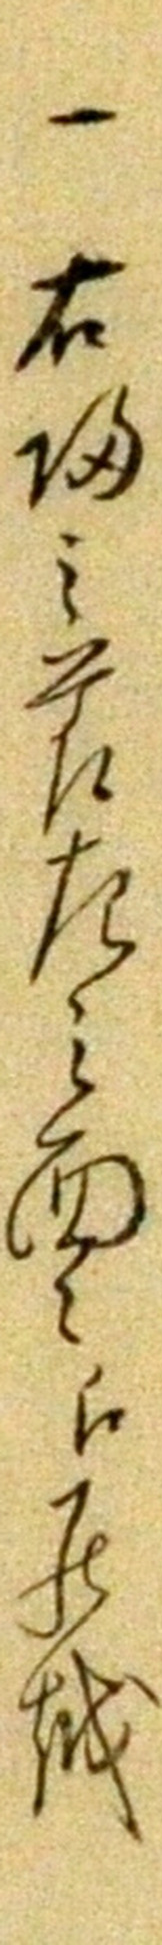一右帰之節左之面々え罷越
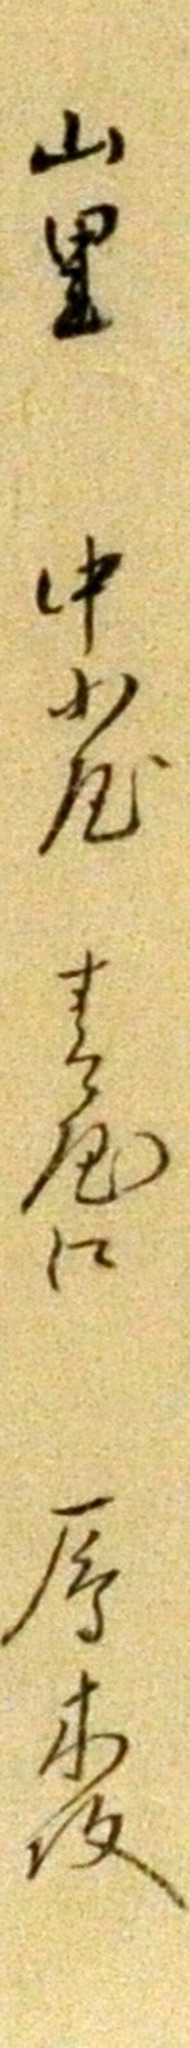山里中小屋青屋口雁木坂
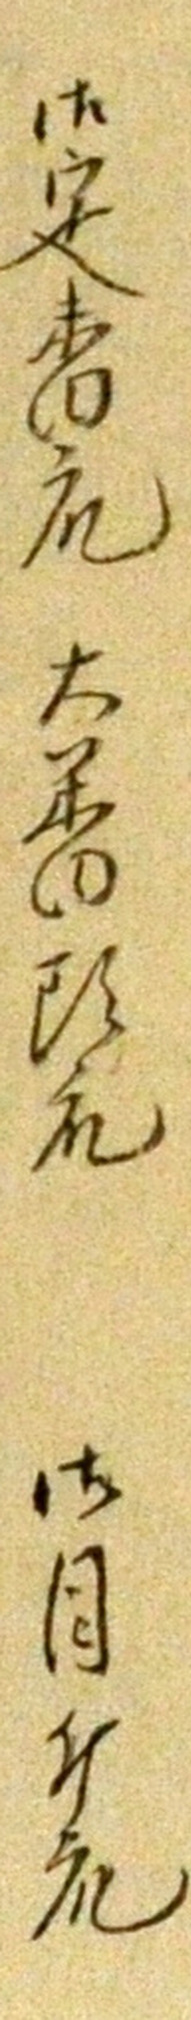御定番衆大番頭衆御目付衆
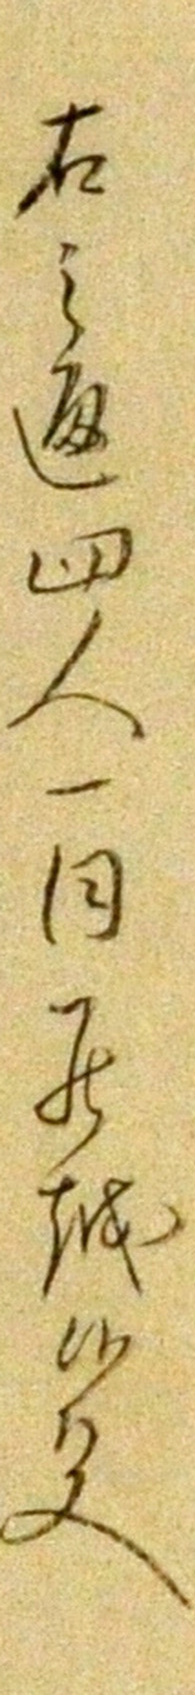右之通四人一同罷越候事
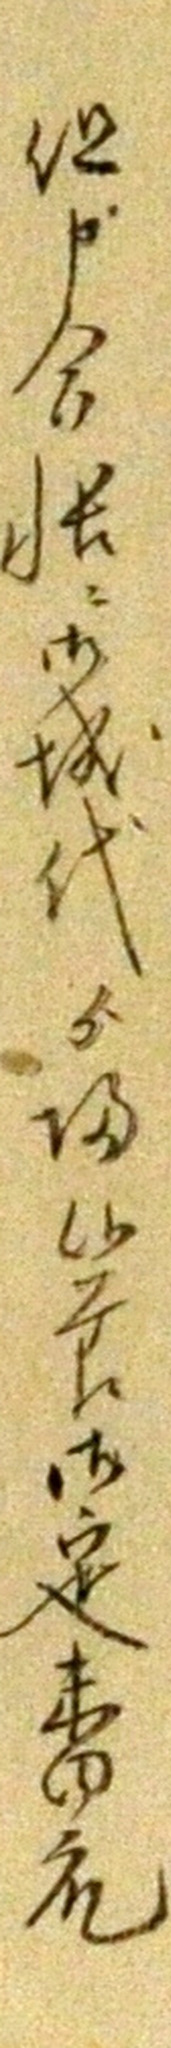但申合帳に御城代ゟ帰候節御定番衆
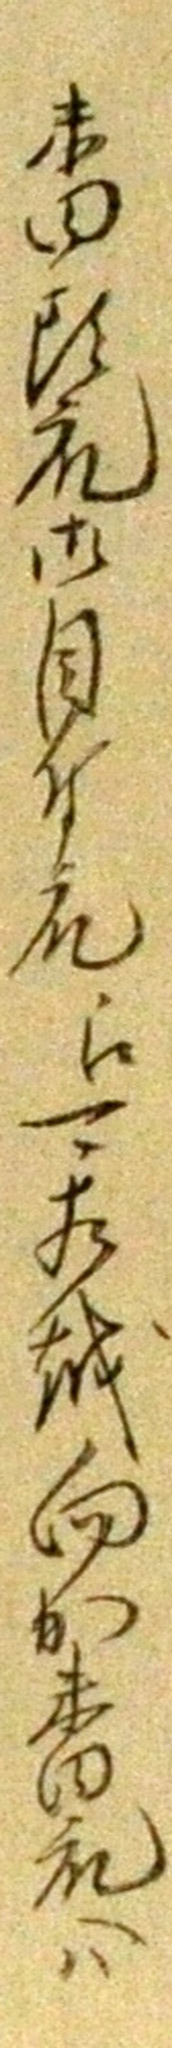番頭衆御目付衆え可相越向加番衆へは
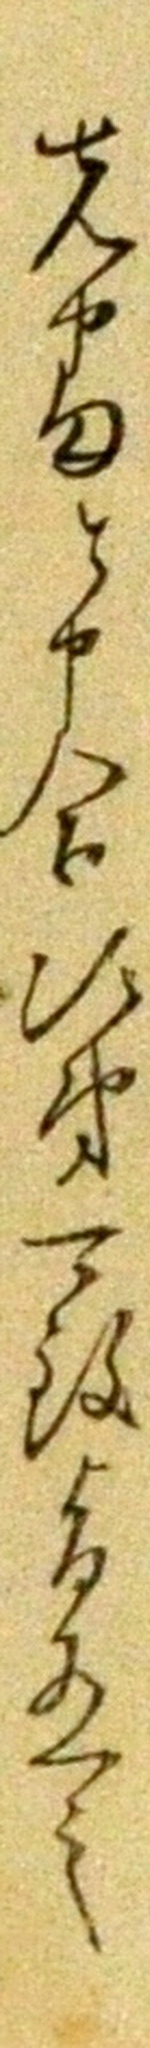先番と申合次第可致旨有之
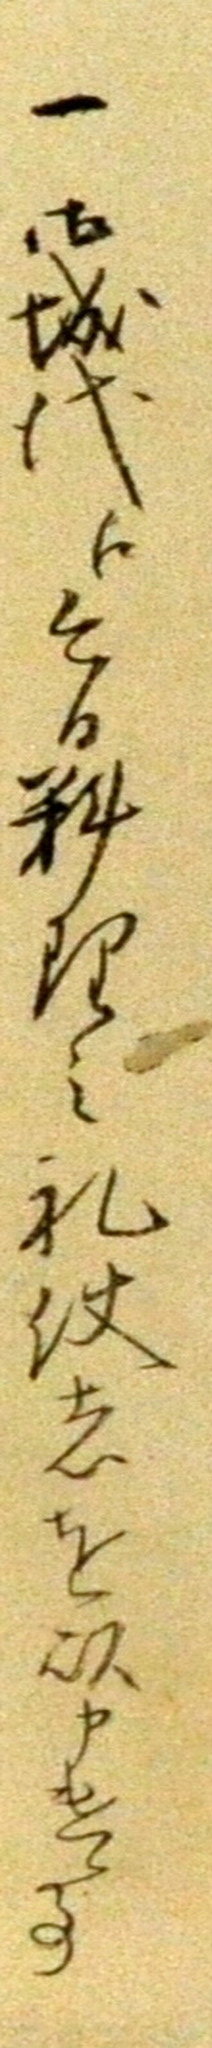一御城代え今日料理之礼使者を以申遣候事
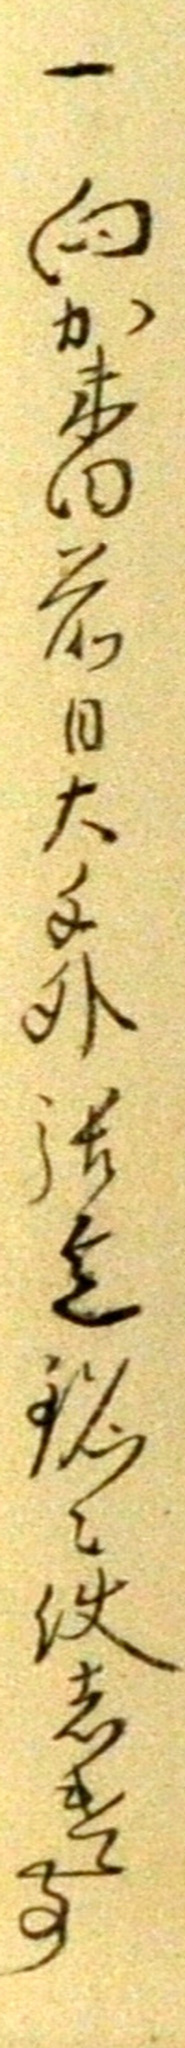一向加番前日大手外張迄銘々使者遣候事

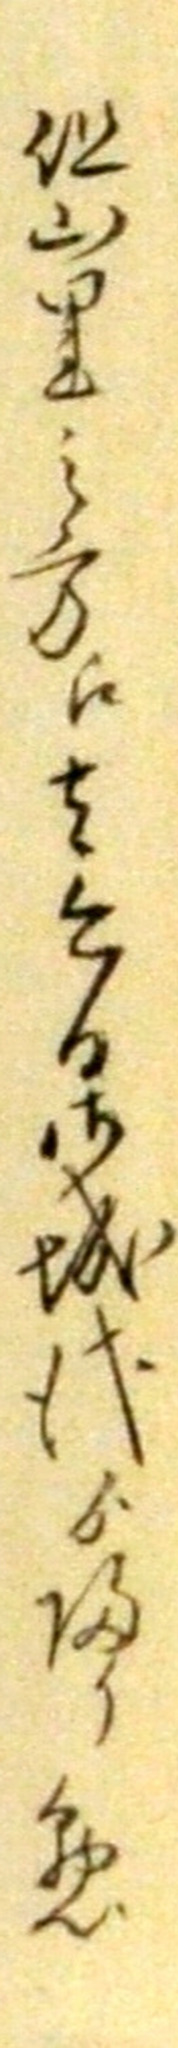但山里之方えは今日御城代ゟ帰り懸
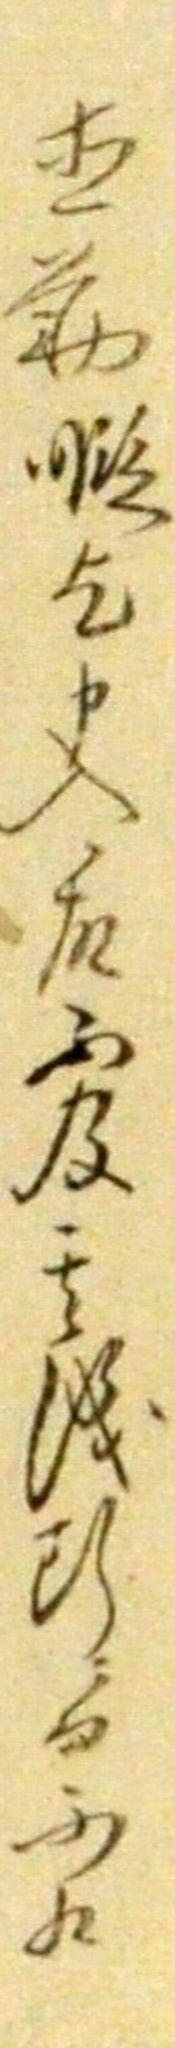直勤暇乞申入候故不及其儀断に而不相
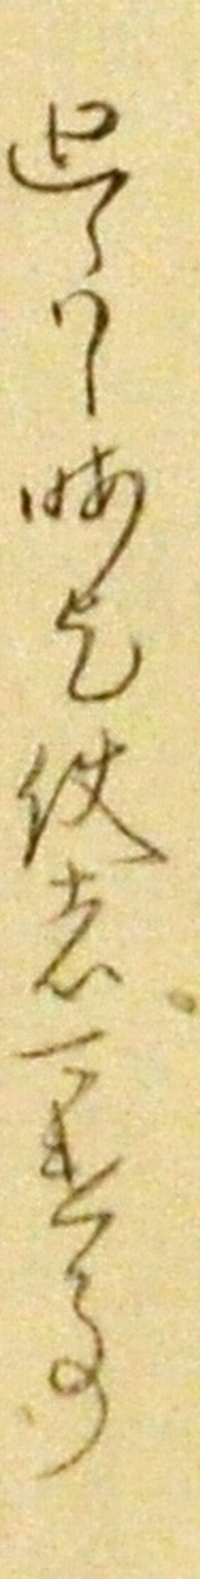廻候はゝ暇乞使者可遣事
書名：大阪加番関係諸書留〔一括〕
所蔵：伊那市立高遠町図書館・合同会社AMANE
